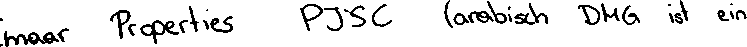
maar Properties PJSC (arabisch DMG ist ein
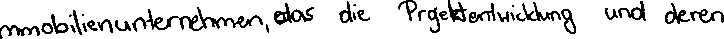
mmobilienunternehmen, das die Projektentwicklung und deren
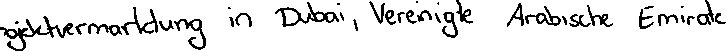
ojektvermarktung in Dubai, Vereinigte Arabische Emirate
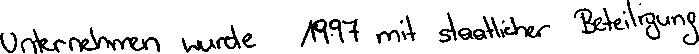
Unternehmen wurde 1997 mit staatlicher Beteiligung
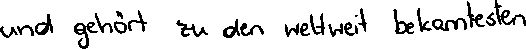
und gehört zu den weltweit bekanntesten
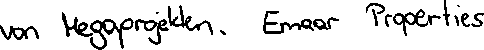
on Megaprojekten. Emaar Properties
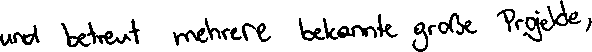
und betreut mehrere bekannte große Projekte,
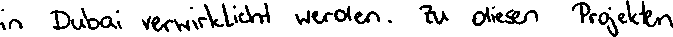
In Dubai verwirklicht werden. Zu diesen Projekten
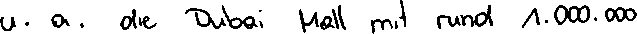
u. a. die Dubai Mall mit rund 1.000.000
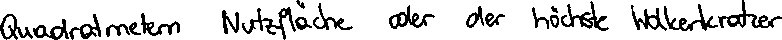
Quadratmetern Nutzfläche oder der höchste Wolkenkratzer
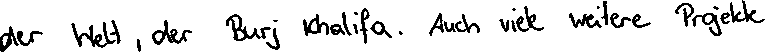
der Welt, der Burj Khalifa. Auch viele weitere Projekte
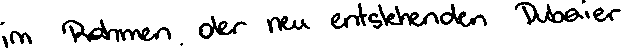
im Rahmen der neu entstehenden Dubaier
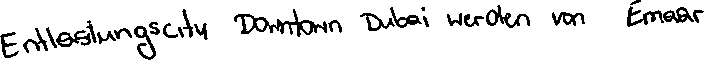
Entlastungscity Downtown Dubai werden von Emaar
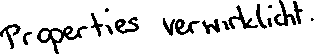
Properties verwirklicht.
